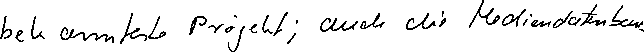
bekannteste Projekt; auch die Mediendatenbank
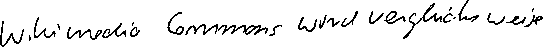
Wikimedia Commons wird vergleichsweise
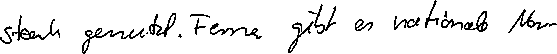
stark genutzt.Ferner gibt es nationale Non-
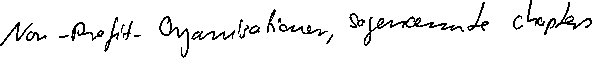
Non-Profit-Organisationen, sogenannte chapters
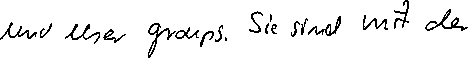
und user groups. Sie sind mit der
